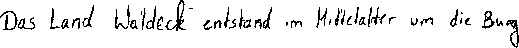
Das Land Waldeck entstand im Mittelalter um die Burg
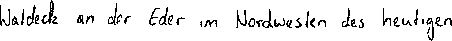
Waldeck an der Eder im Nordwesten des heutigen
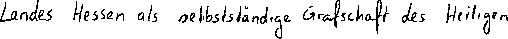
Landes Hessen als selbständige Grafschaft des Heiligen
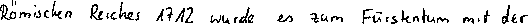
Römischen Reiches. 1712 wurde es zum Fürstentum mit der
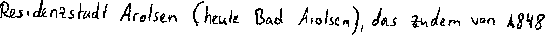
Residenzstadt Arolsen (heute Bad Arolsen), das zudem von 1848
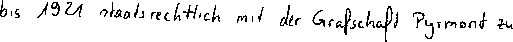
bis 1921 staatsrechtlich mit der Grafschaft Pyrmont zu
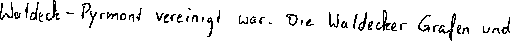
Waldeck-Pyrmont vereinigt war. Die Waldecker Grafen und
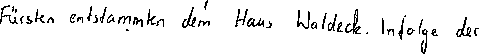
Fürsten entstammten dem Haus Waldeck. Infolge der
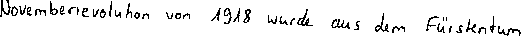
Novemberrevolution von 1918 wurde aus dem Fürstentum
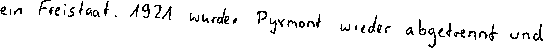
ein Freistaat. 1921 wurde Pyrmont wieder abgetrennt und
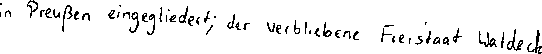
in Preußen eingegliedert; der verbliebene Freistaat Waldeck
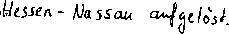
Hessen-Nassau aufgelöst.
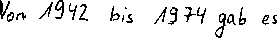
Von 1942 bis 1974 gab es
